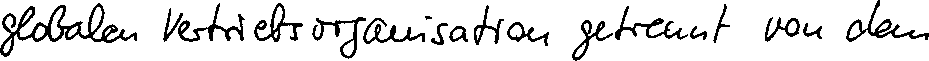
globalen Vertriebsorganisation getrennt von dem
